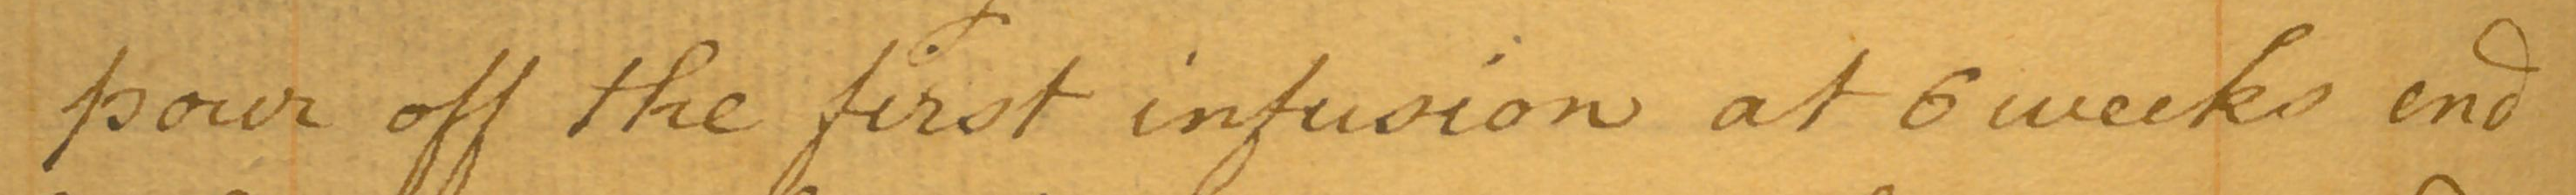pour off the first infusion at 6 weeks end
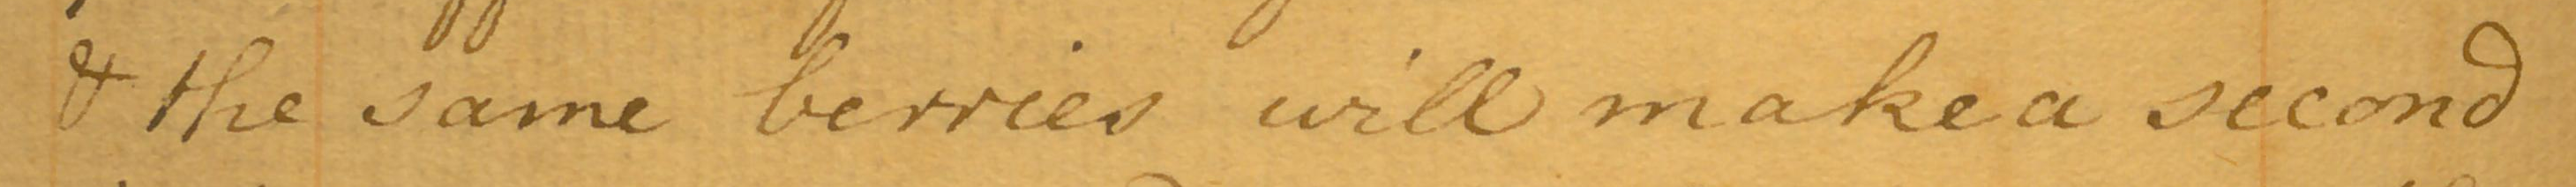& the same berries will make a second
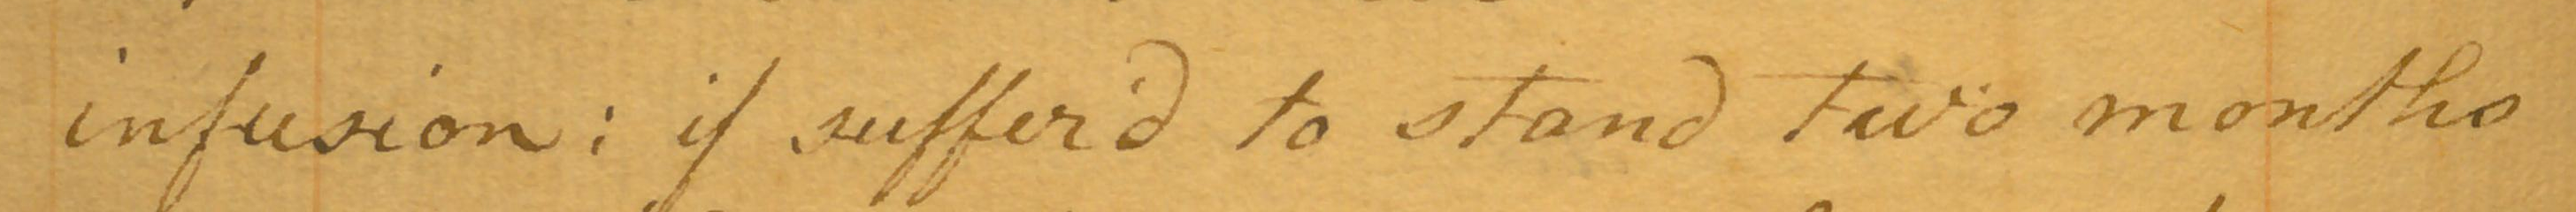infusion: if suffer'd to stand two months
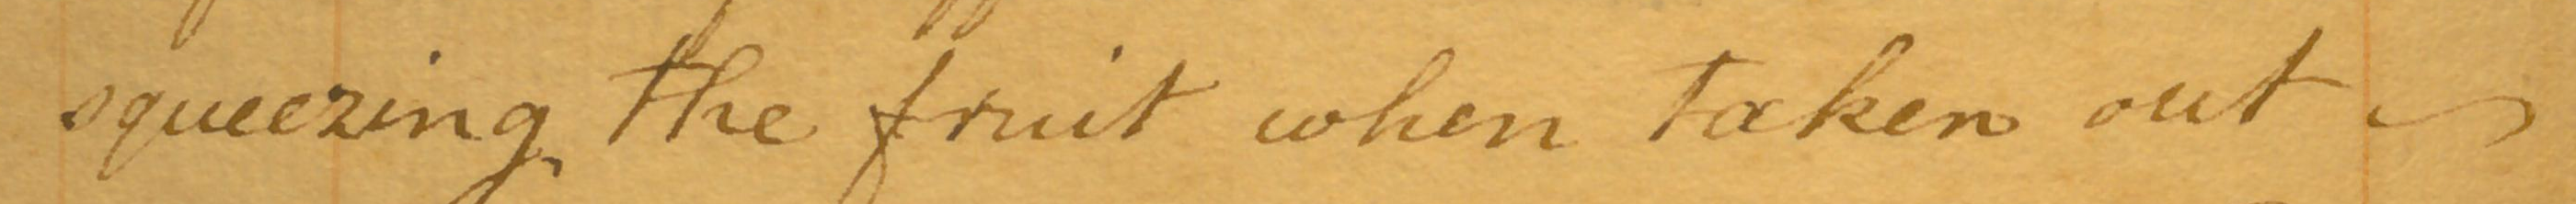squeezing the fruit when taken out-
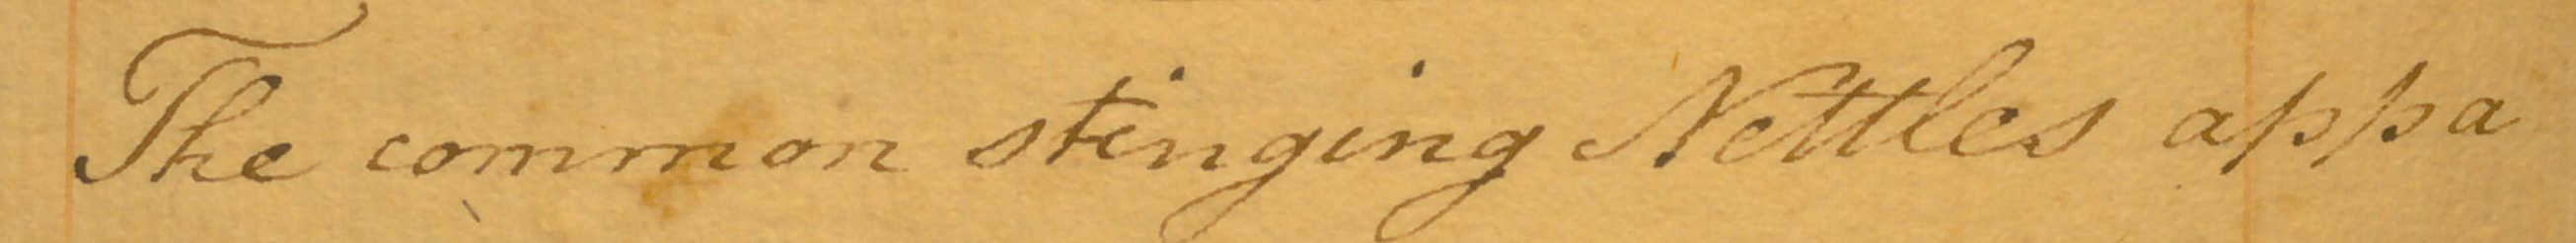The common stinging Nettles appa
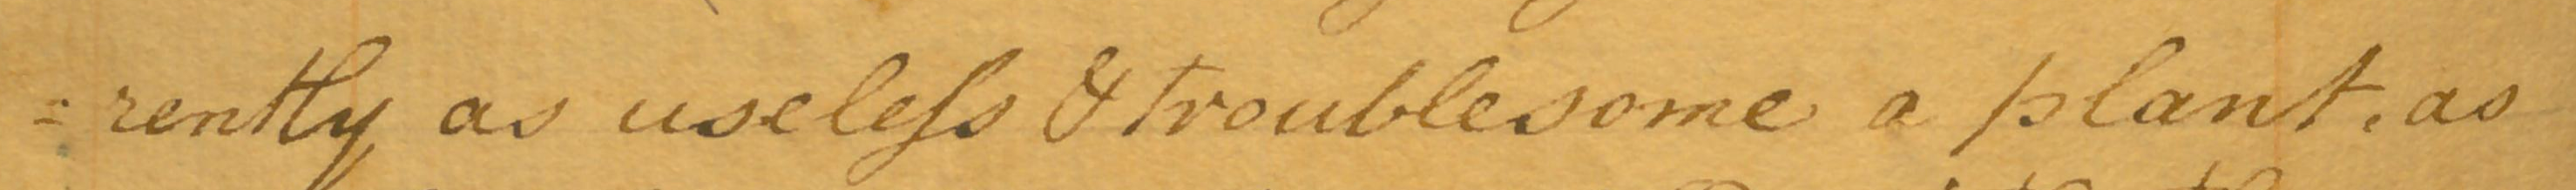-rently as useless & troublesome a plant, as
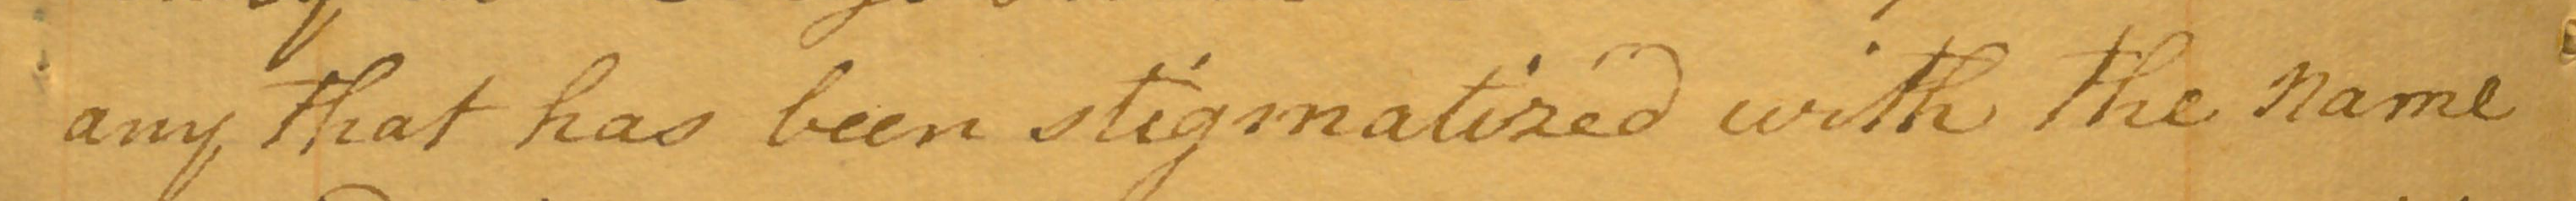any that has been stigmatized with the name
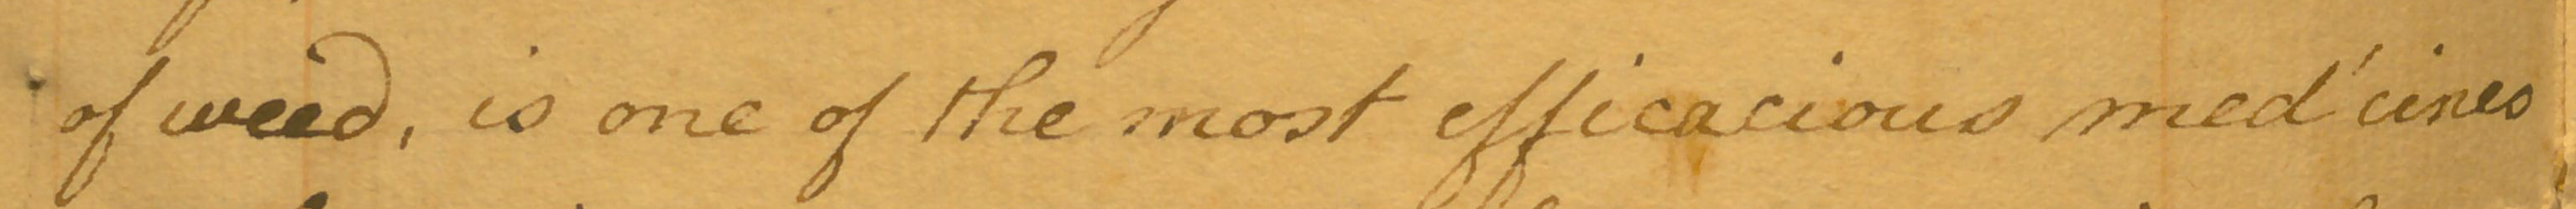of weed, is one of the most efficacious med'cines
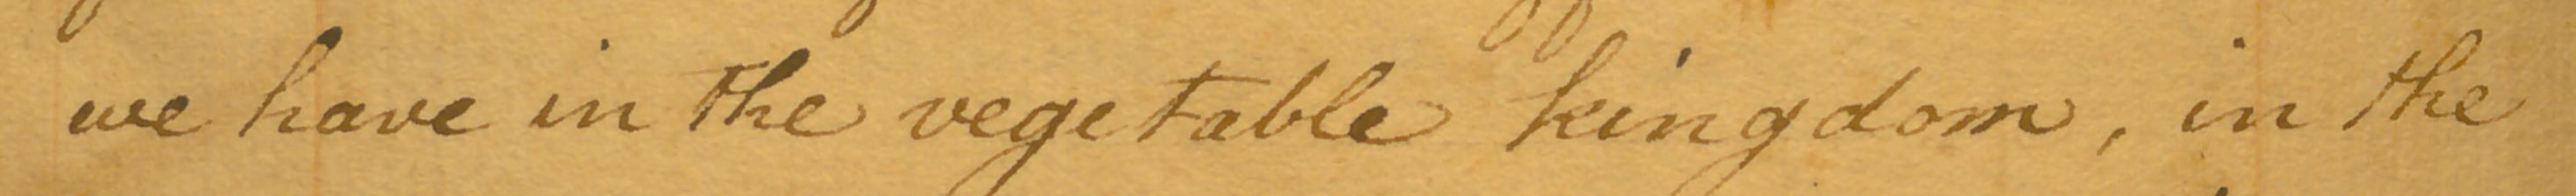we have in the vegetable kingdom, in the
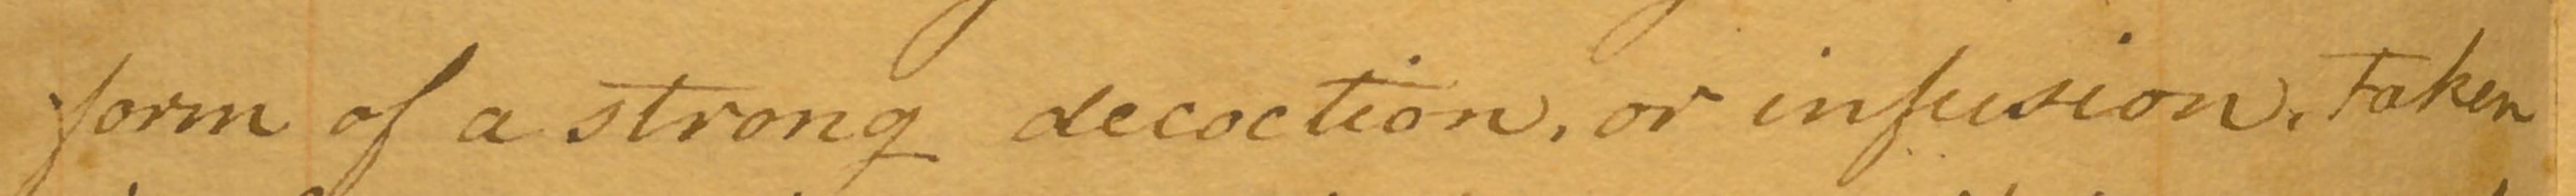form of a strong decoction, or infusion, taken
